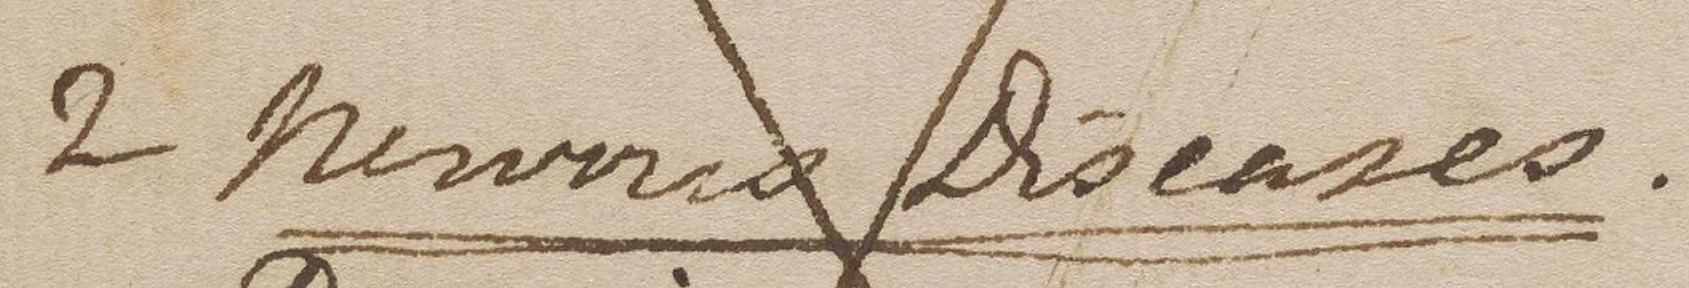2 Nervous Diseases
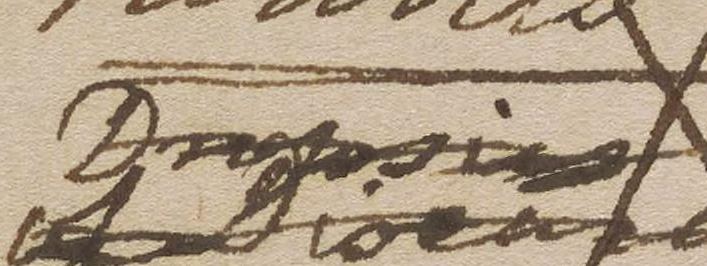[Diagnosis]
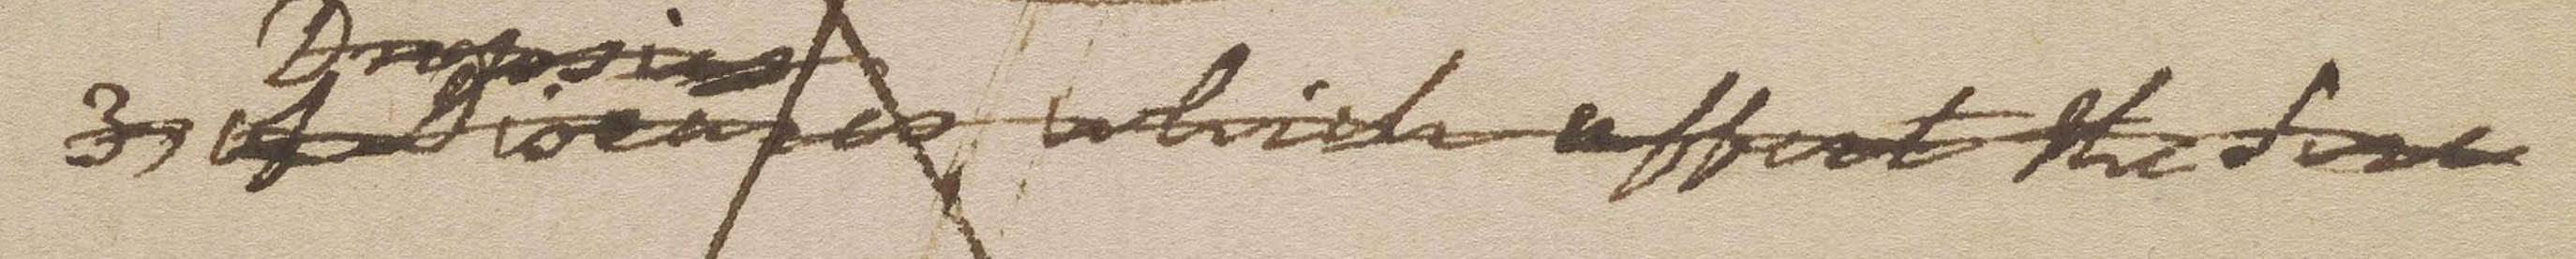[3 of Diseases which affect the Sen]
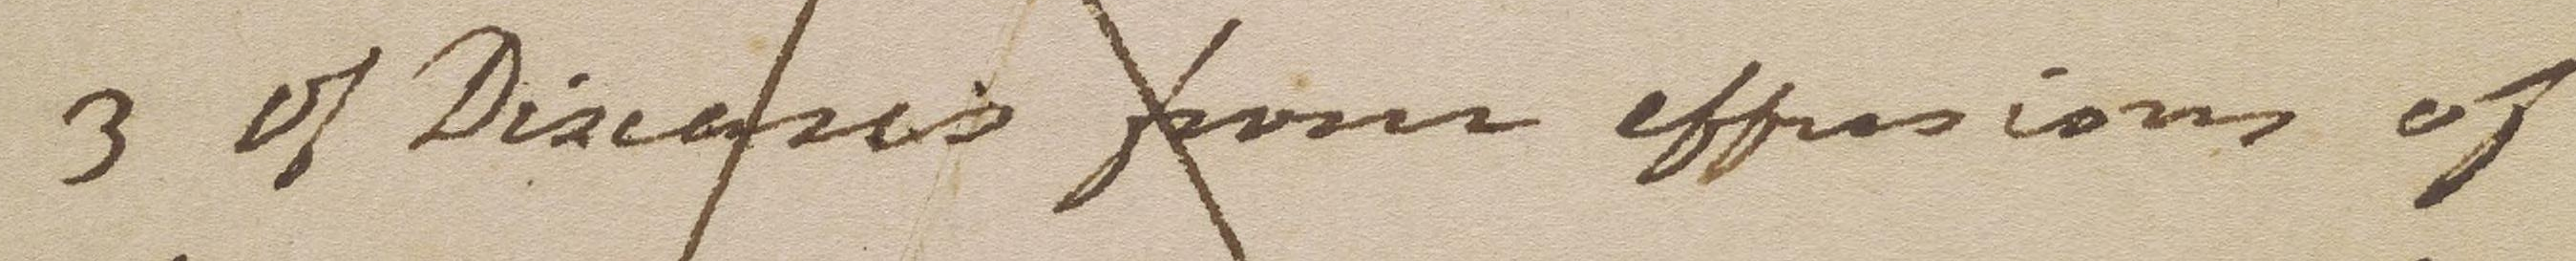3 of Diseases from effusions of
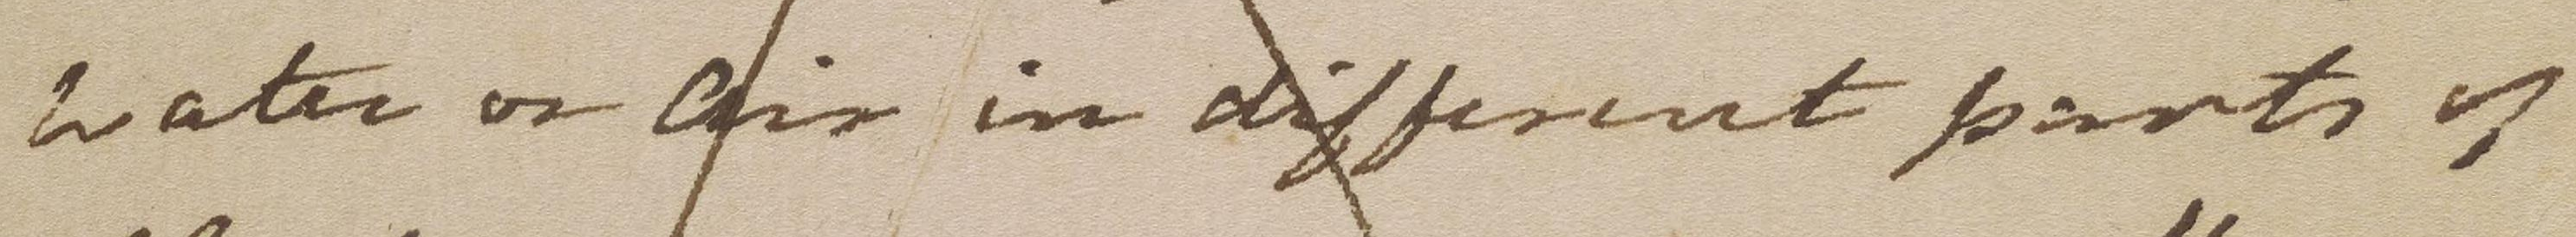water or air in different parts of
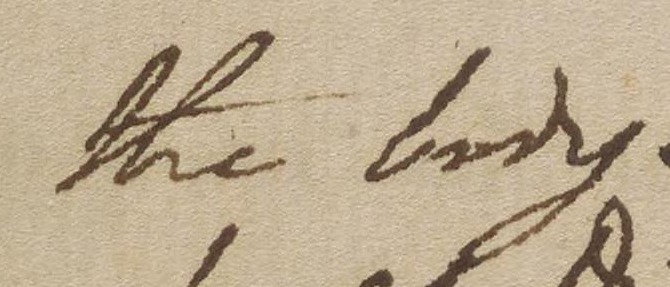the body.
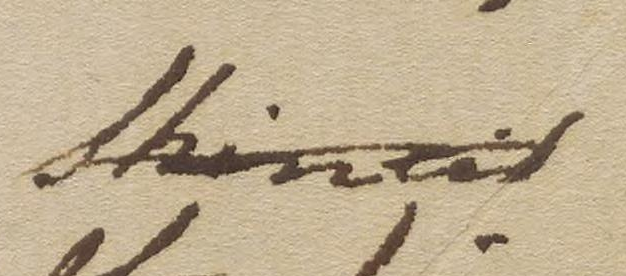Shivers
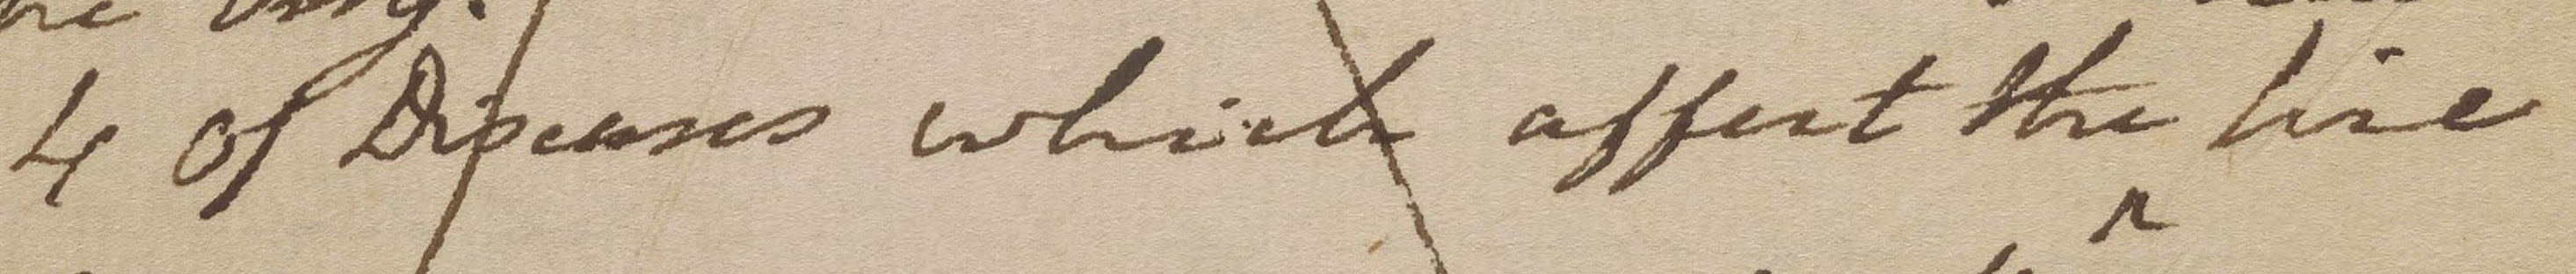4 of Diseases which affect the ^ fire,
